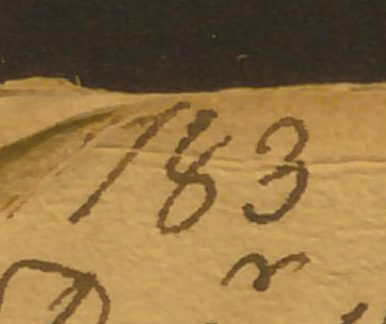783
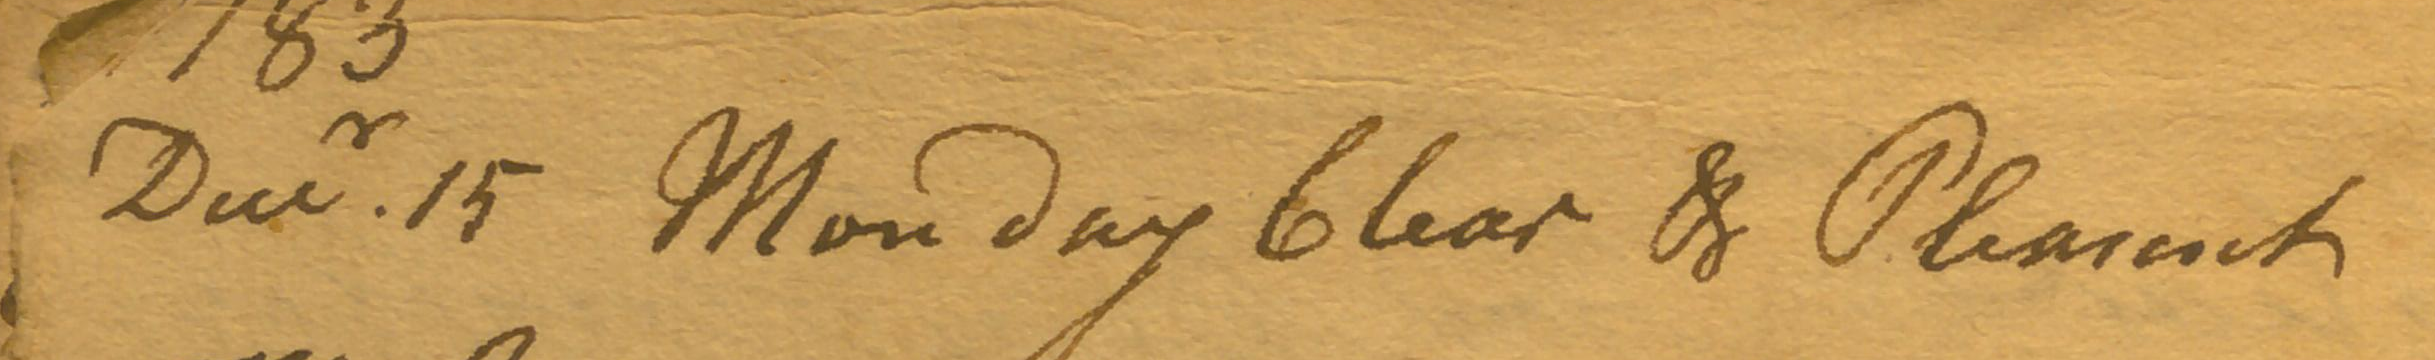Dece^r. 15 Monday Clear & Pleasent
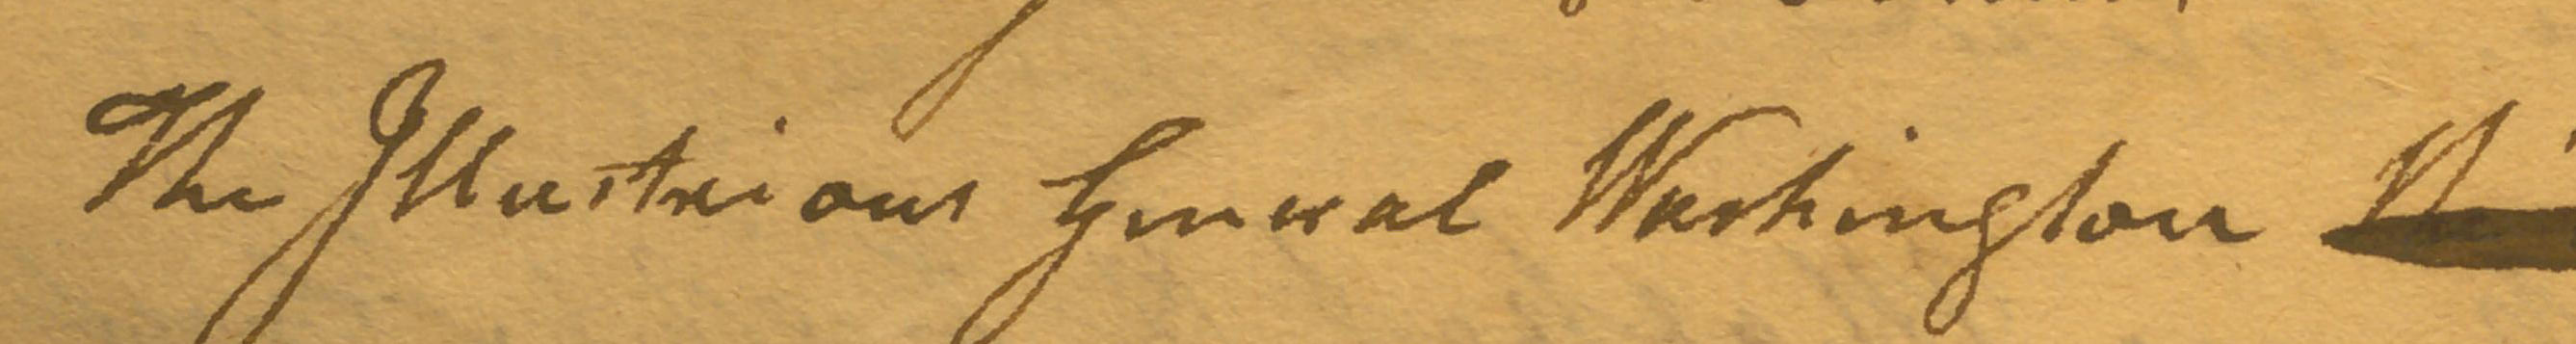The Illustrions General Washington [__]
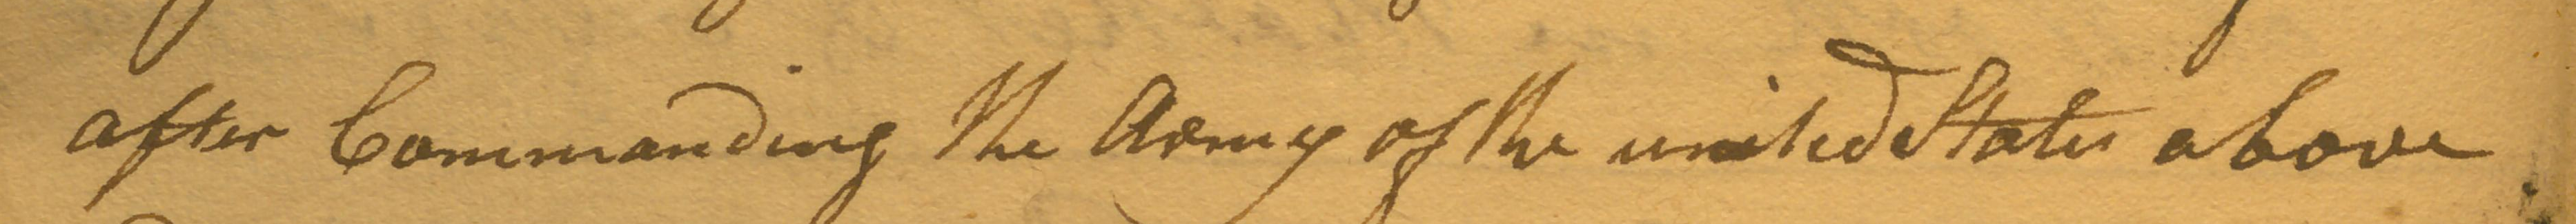after Commanding the Army of the united States above
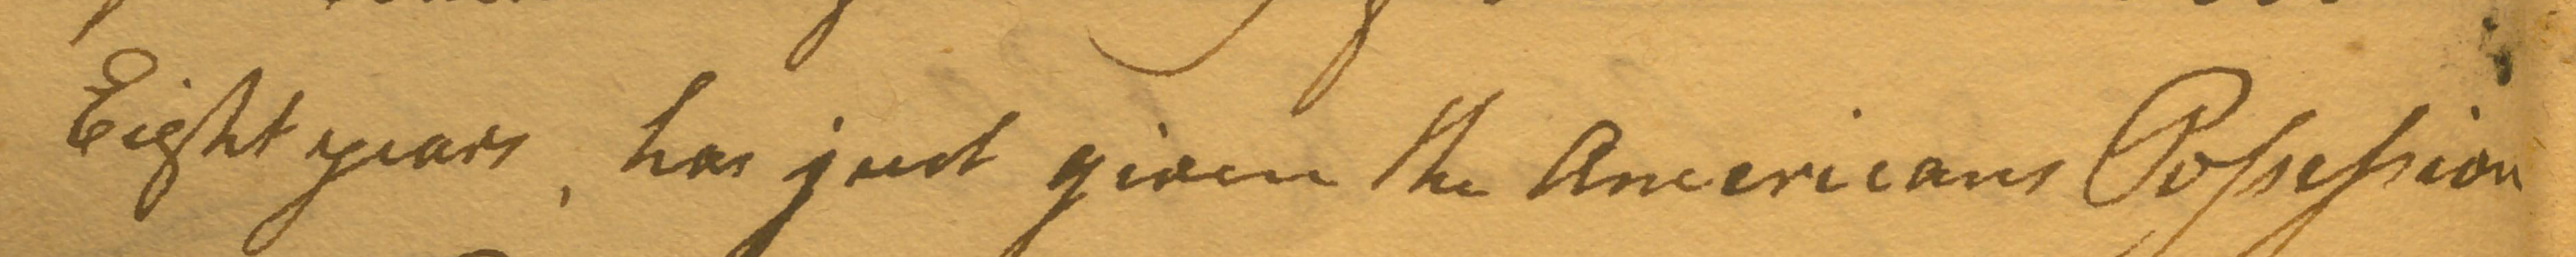Eight years has just given the Americans Possession
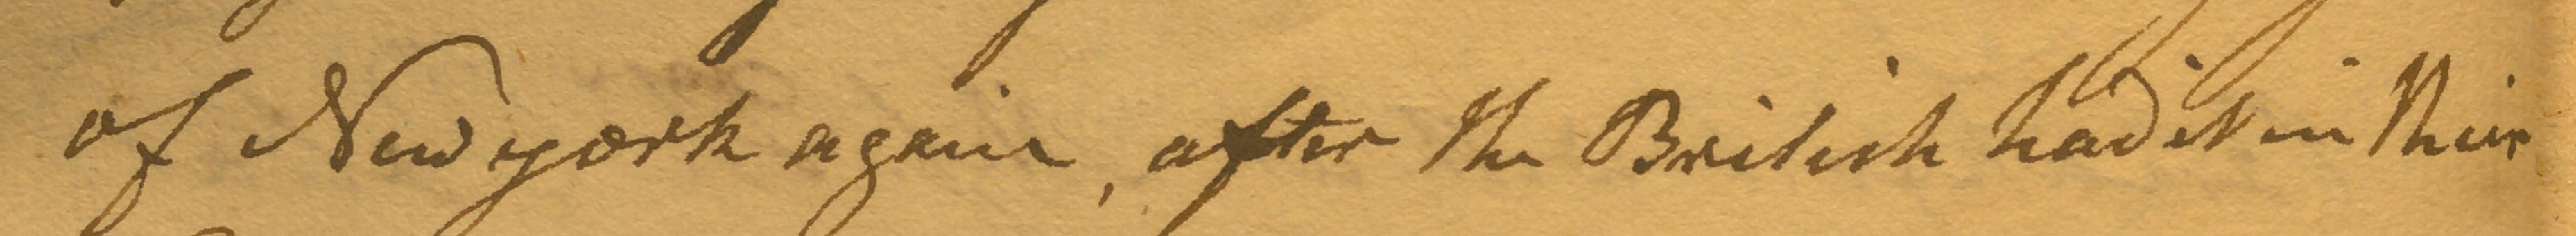of New york again, after the British had it in their
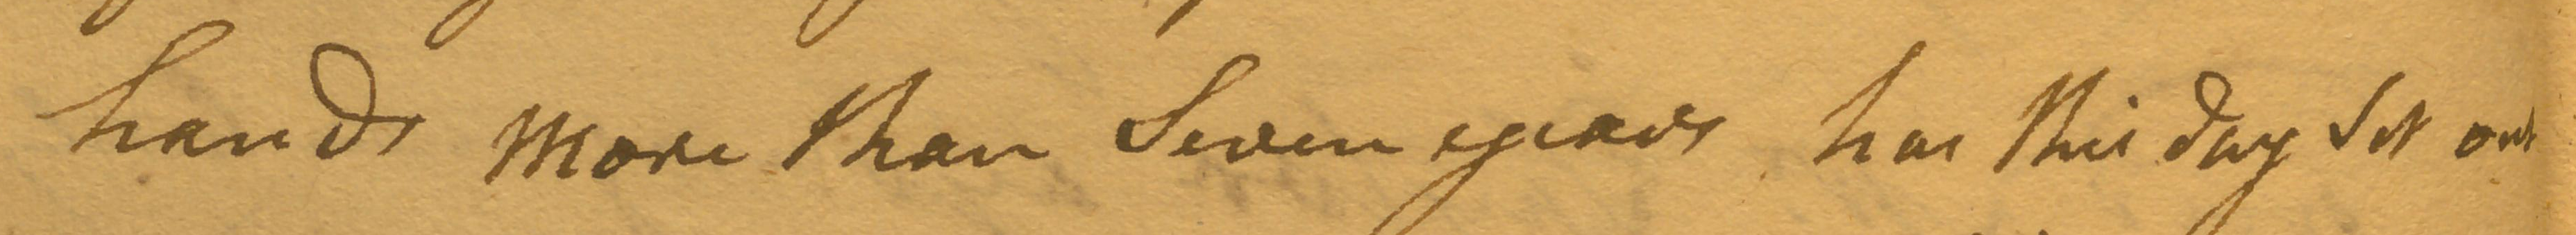hands more than seven yeads has this day Set on
